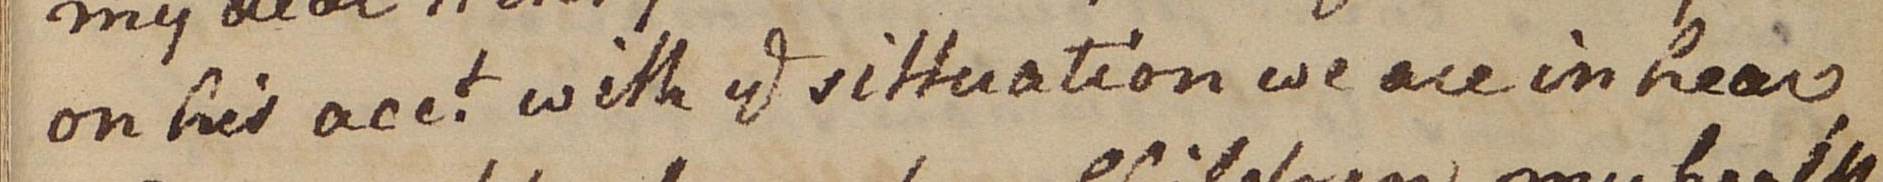on his acc^t. with y^e sittuation we are in hear
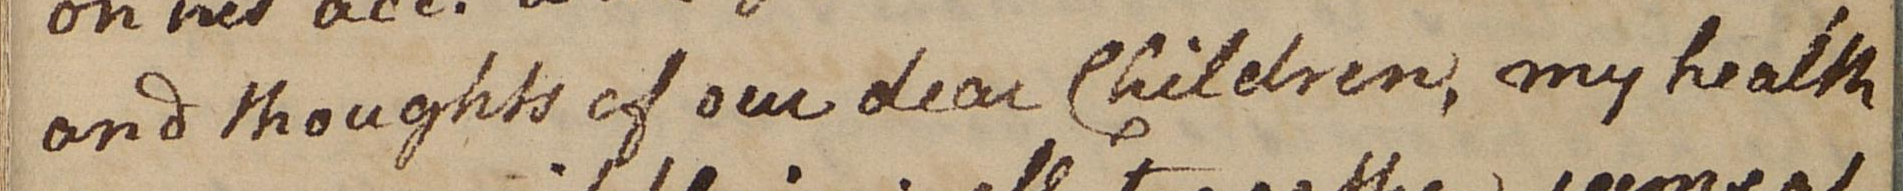and thoughts of our dear Children, my health
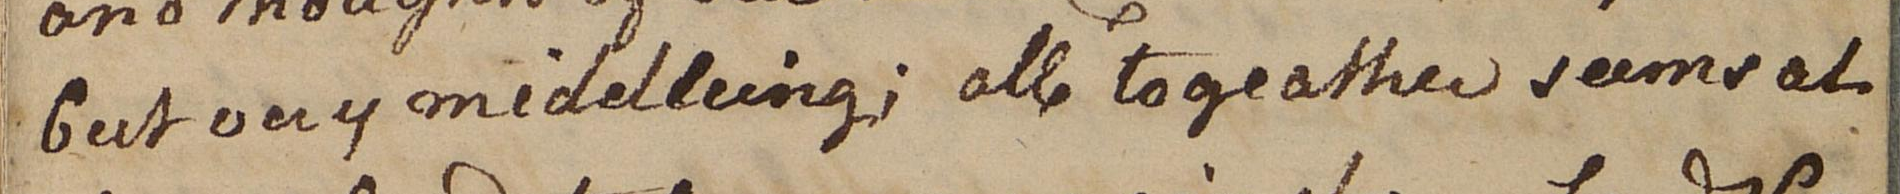but very midelleing; all togeather seems at
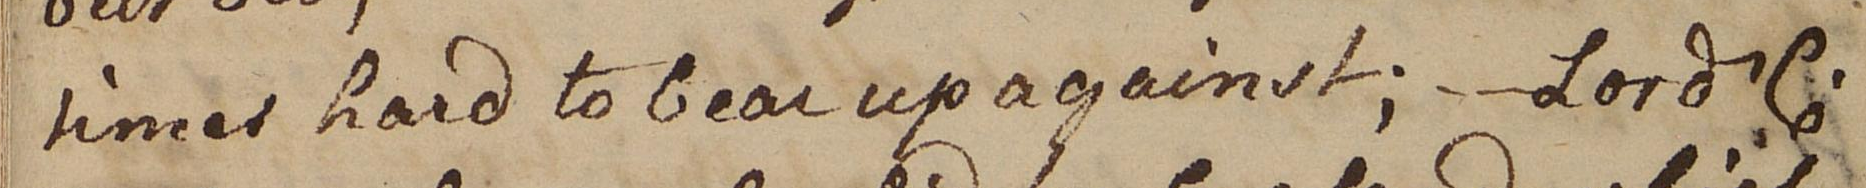times hard to bear up against;- Lord C.
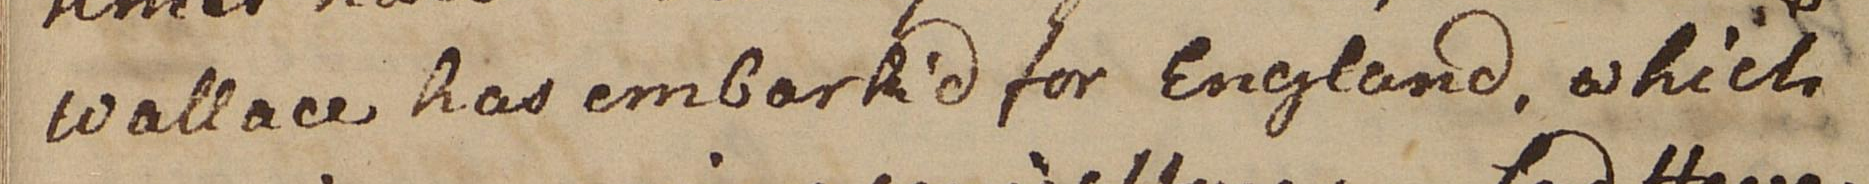Wallace has embark'd for England, which
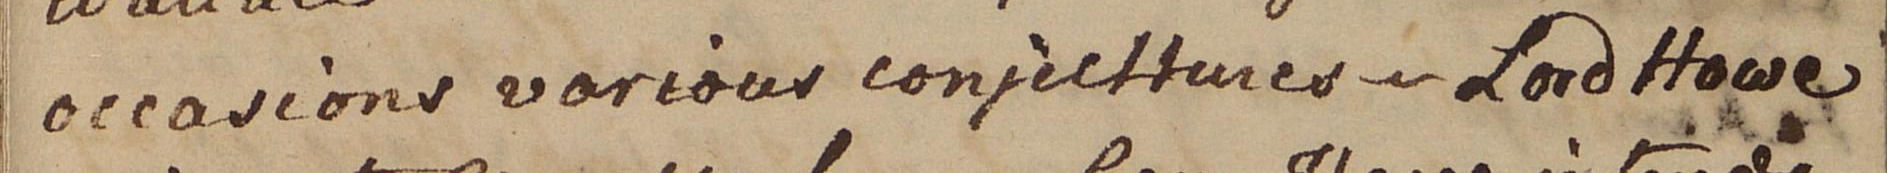occasions various conjecttures- Lord Howe
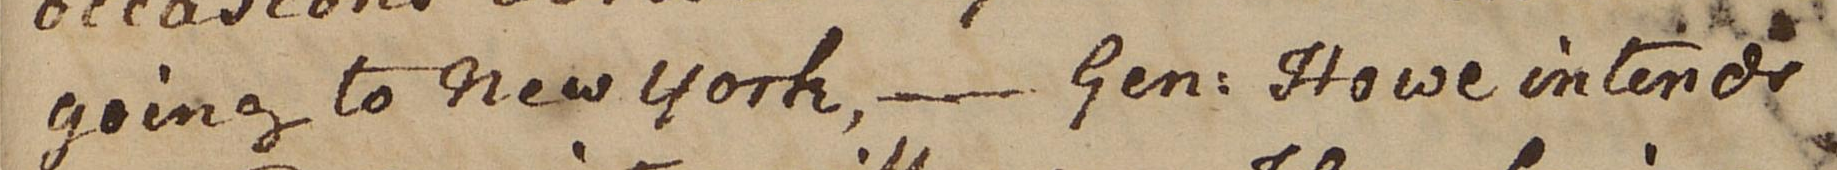going to New York- Gen: Howe intends
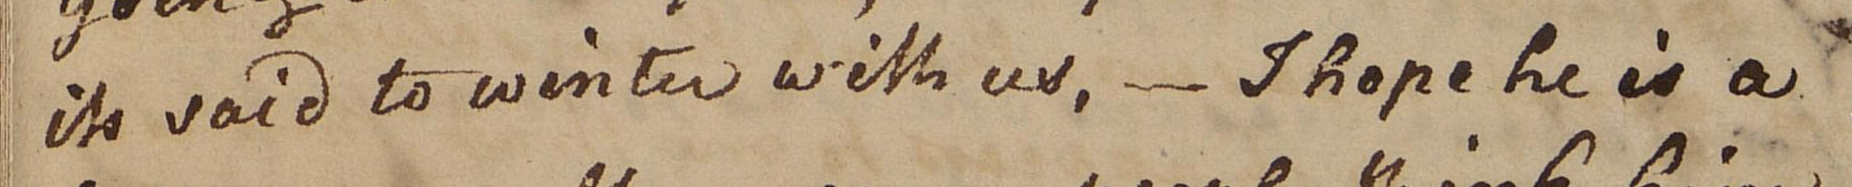its said to winter with us,- I hope he is a
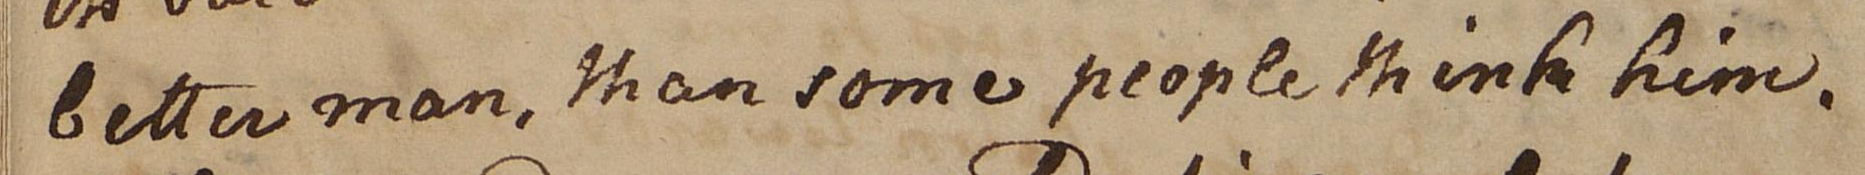better man, than some people think him.
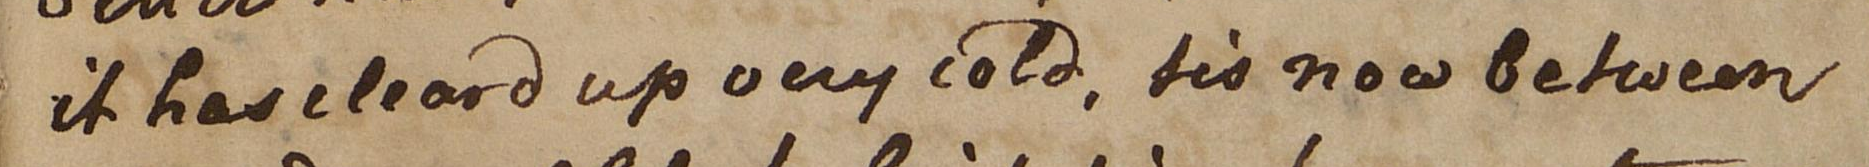it has cleard up very cold, tis now between
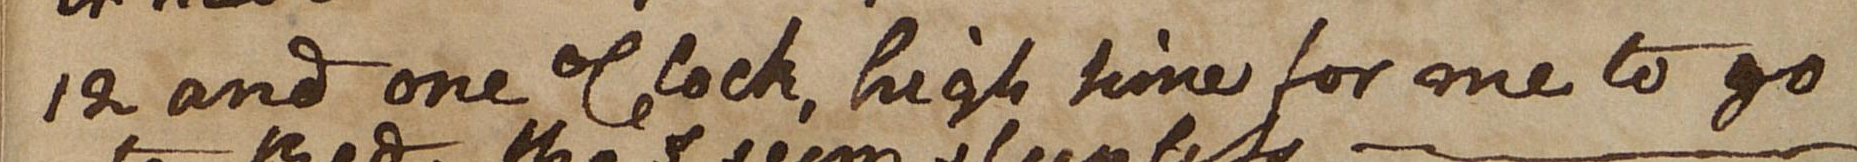12 and one ^oClock, high time for me to go
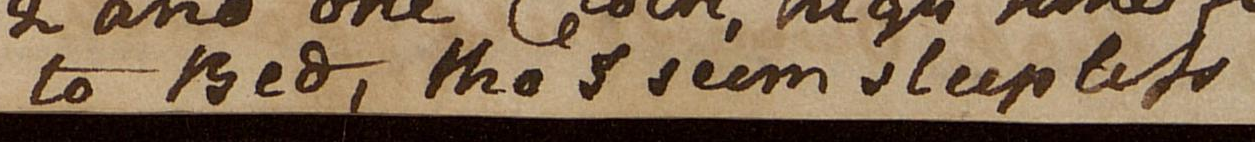to Bed, tho I seem sleepless
